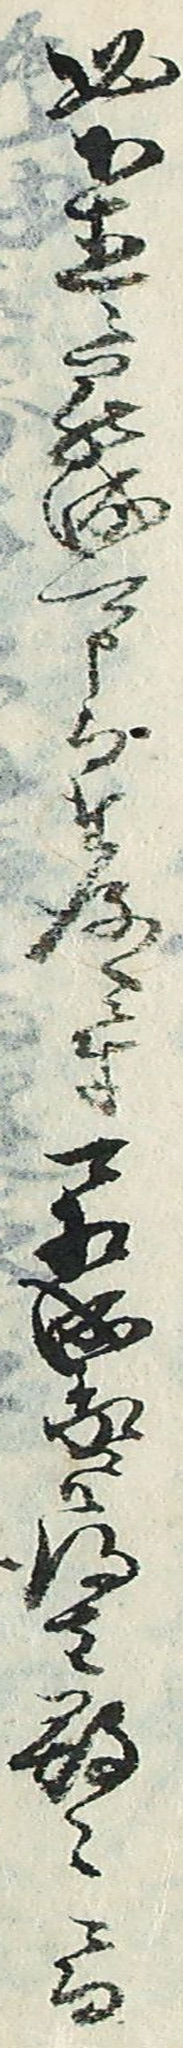必下直に罷成可申と奉存候に付可相成義に候得者郡々に而
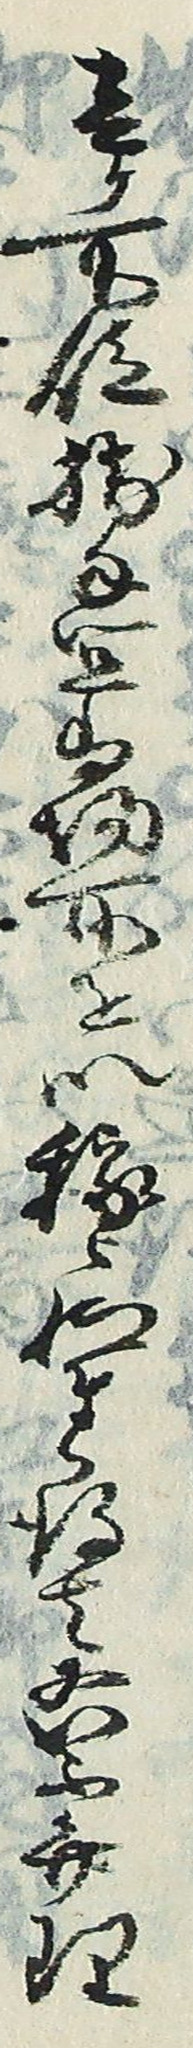壱ケ所位勝手宜布場所を以稼被仰付候得者右不弁理
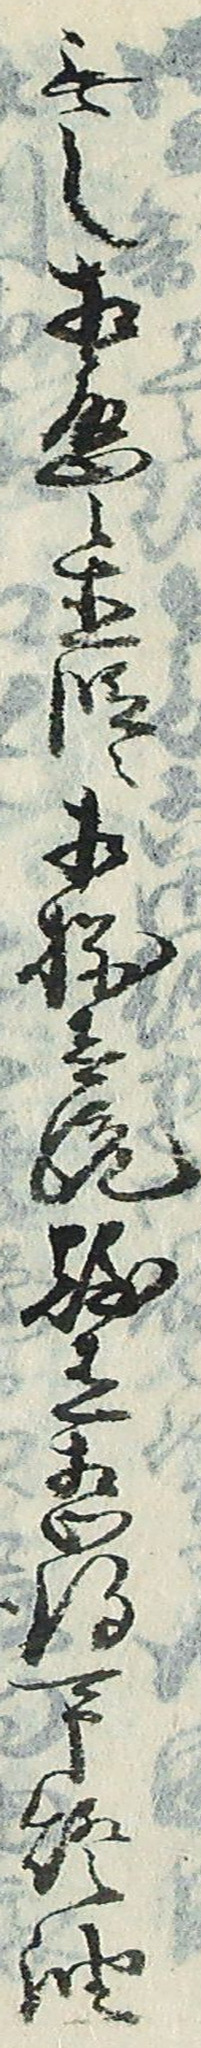無之相応之直段に相捌壱統難有相心得可申燈油
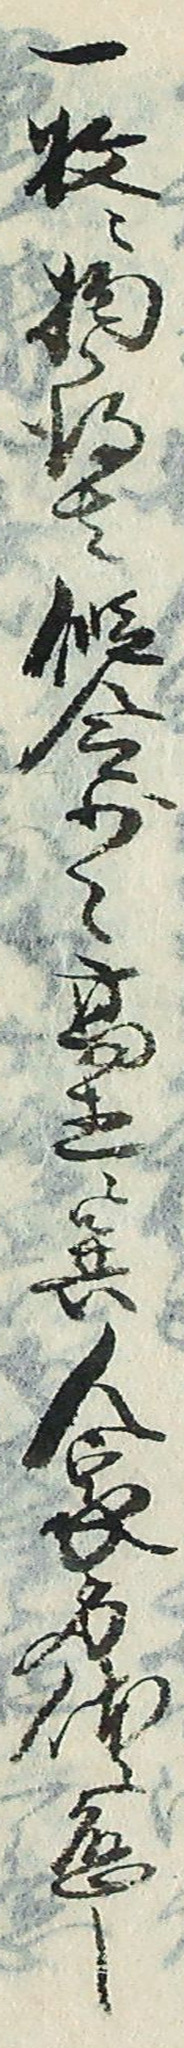一牧に拘候得者縦令少々高直に候共人家身体に応し
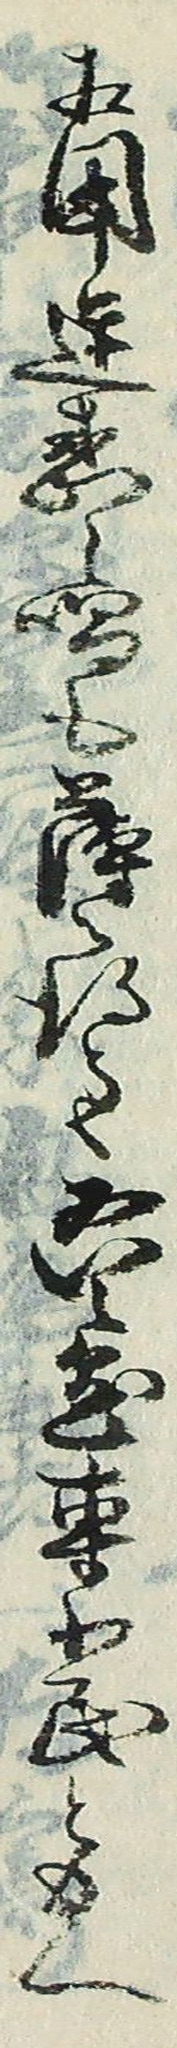相用迷惑之唱も薄く候得とも右之懸専小民ともへ
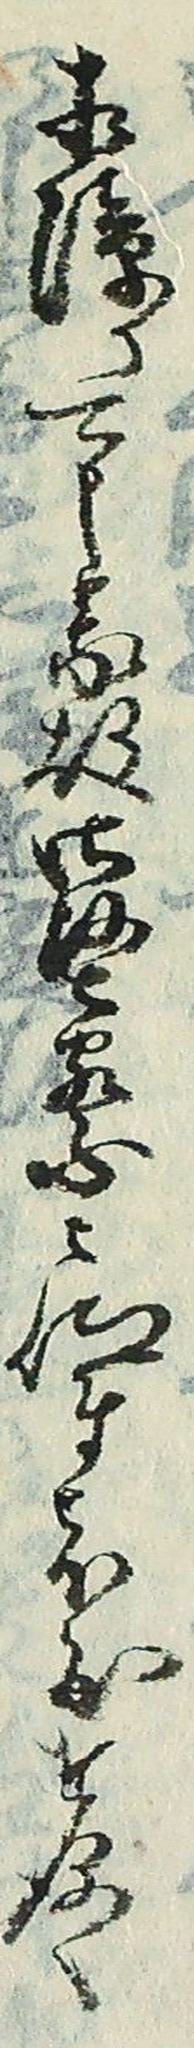相障り可申義故御堅察被仰付被下度奉存候
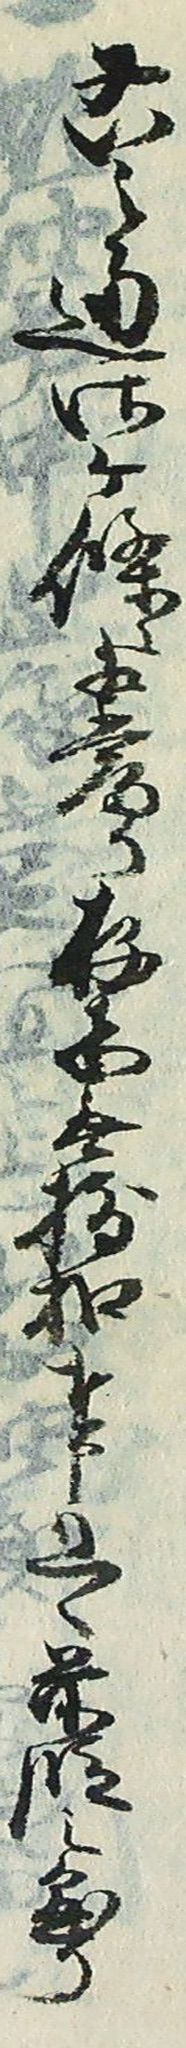右之通御ケ條に相当り存志無指扣奉申且々前段之懸り
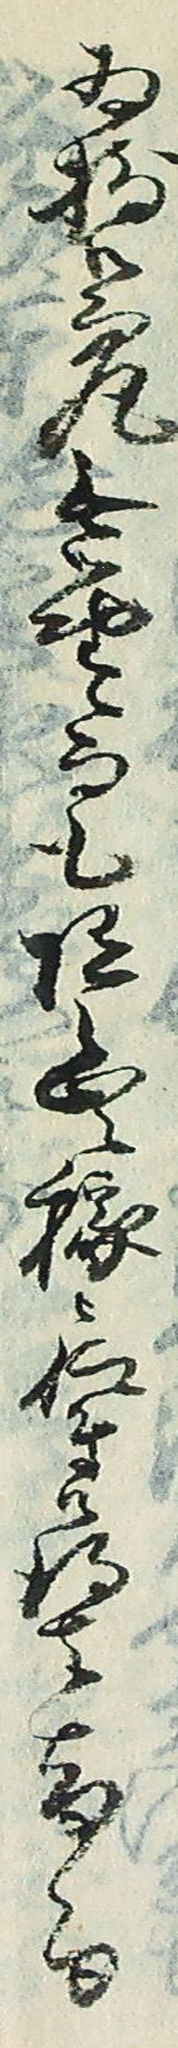為指御究無御坐候而も随意に稼被仰付候得者商之義
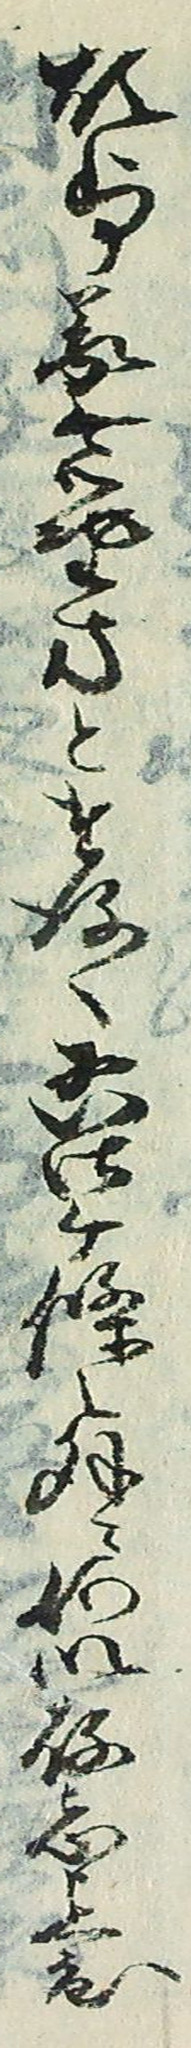煩布義無御座方と奉存候右御ケ條之外に何以存志申上度
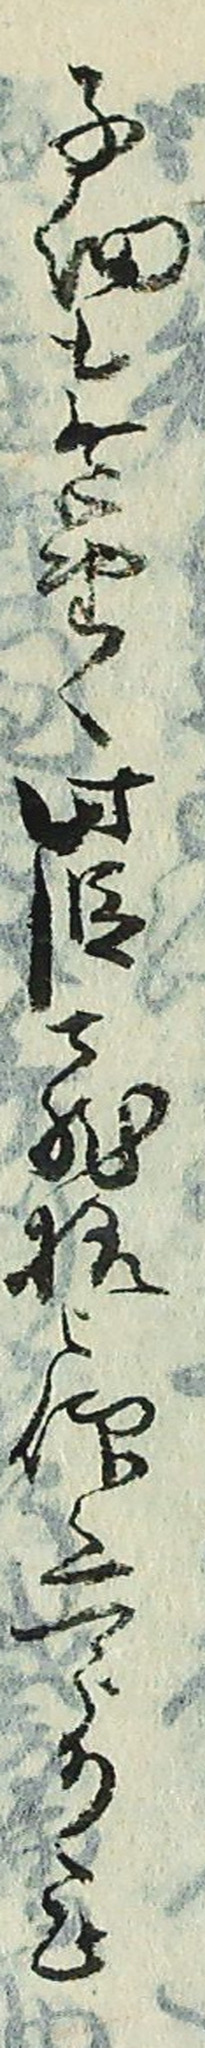子細も無御坐候此段可然様被仰上可被下候以上
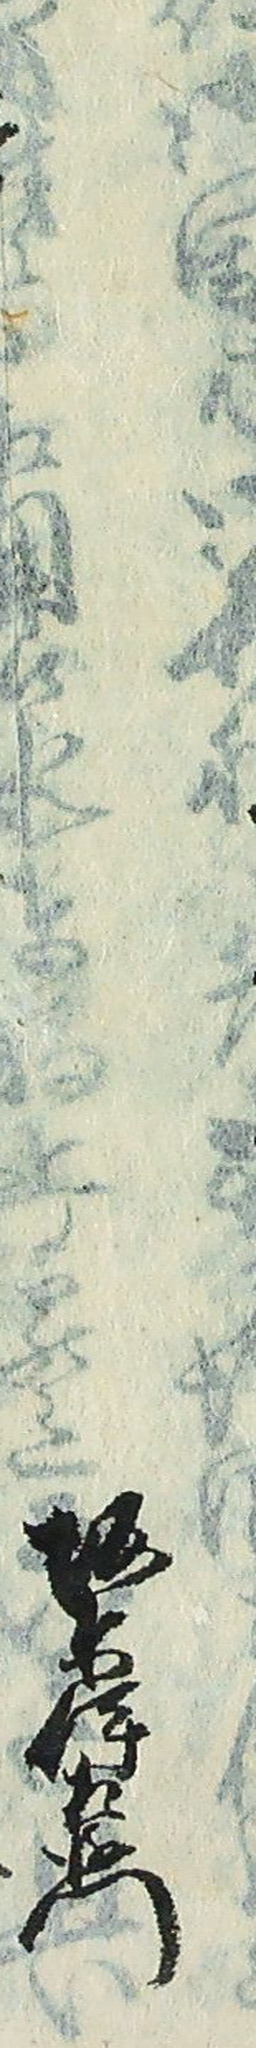坂東伊左衛門
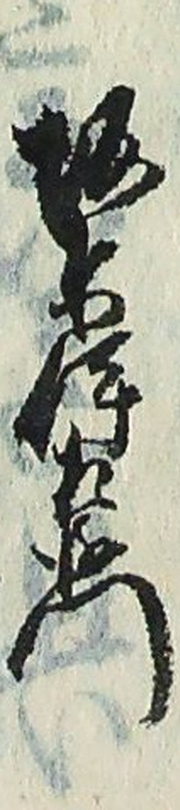坂東伊左衛門
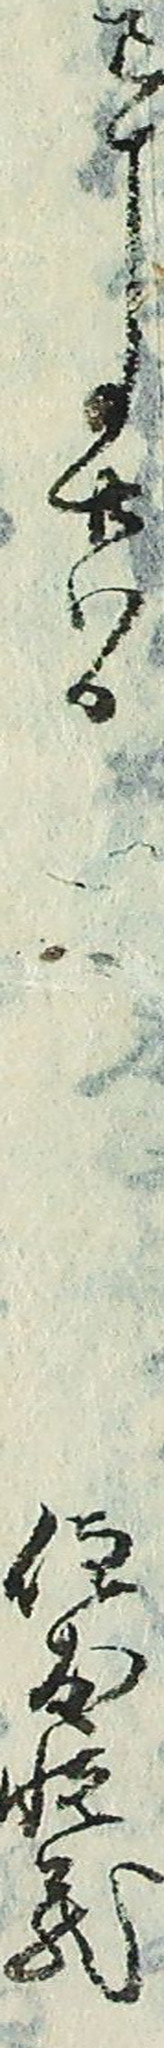巳十月廿八日住友悦蔵
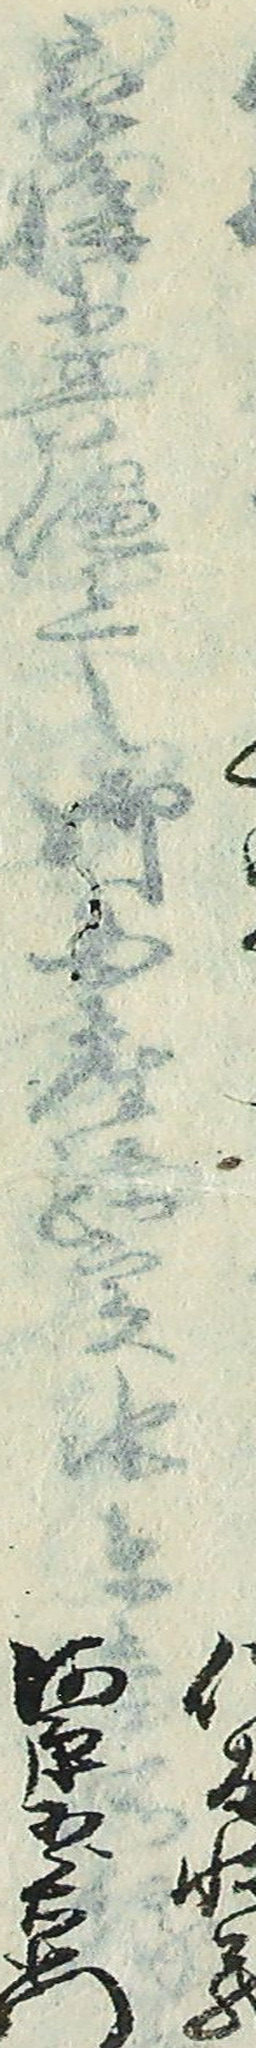河原五郎右衛門
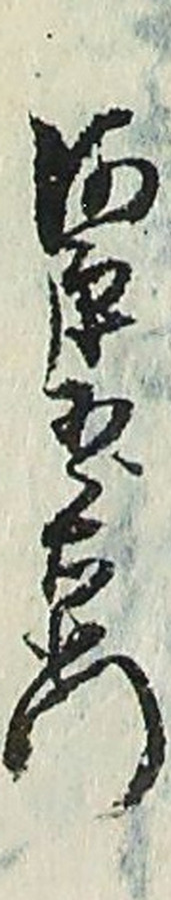河原五郎右衛門
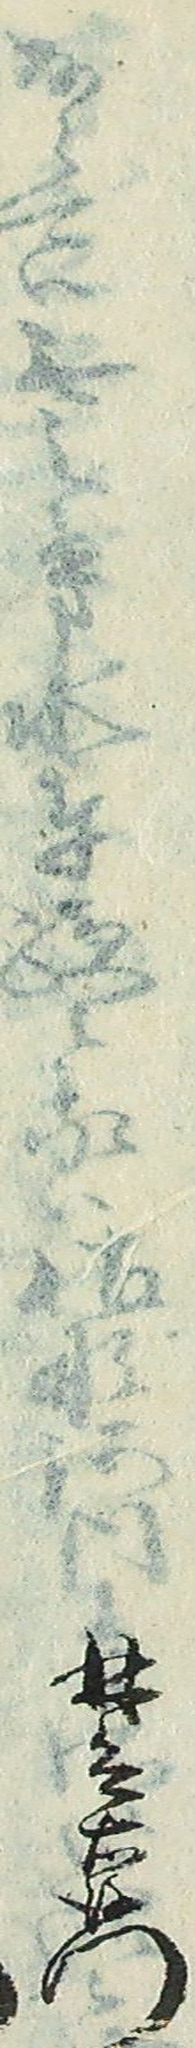林兵右衛門
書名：油稼御取究ニ附御箇條書テ以被仰渡南北同役申談御答書控
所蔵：鳴門教育大学 Naruto University of Education
